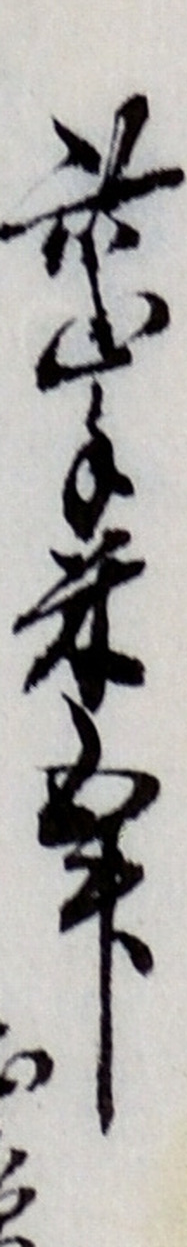此山手米五升
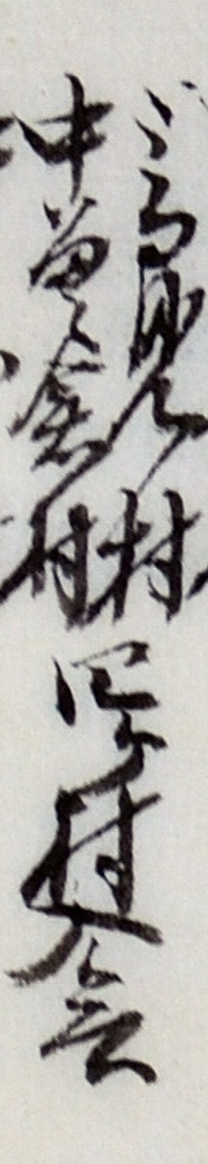高見村四ヶ村入会
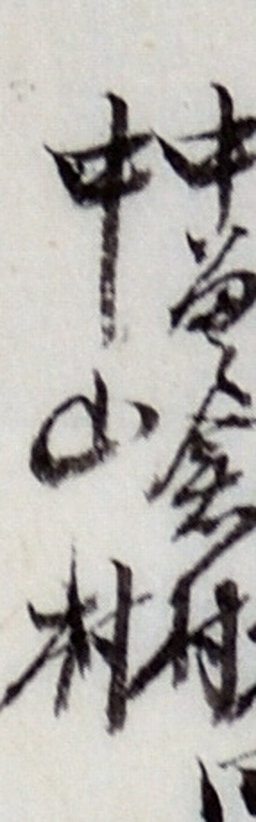中山村
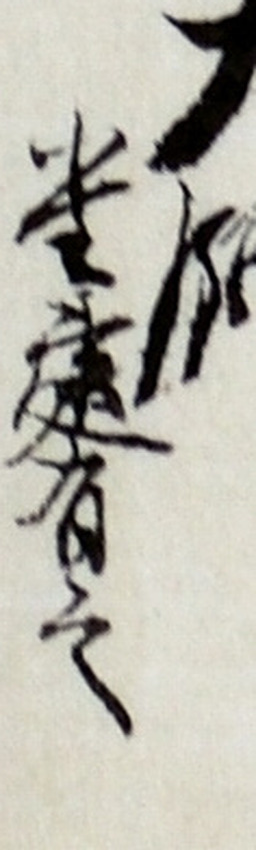堂建有之
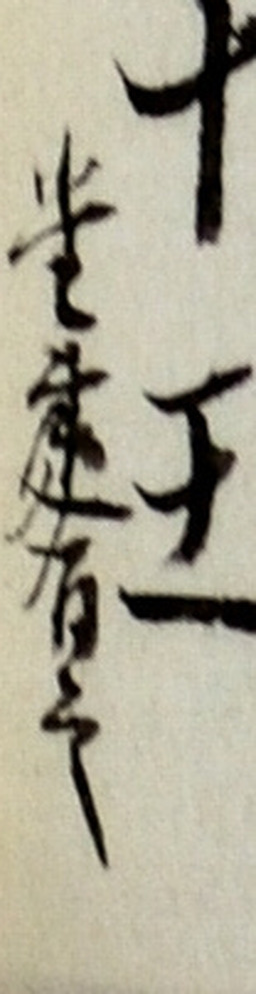堂建有之
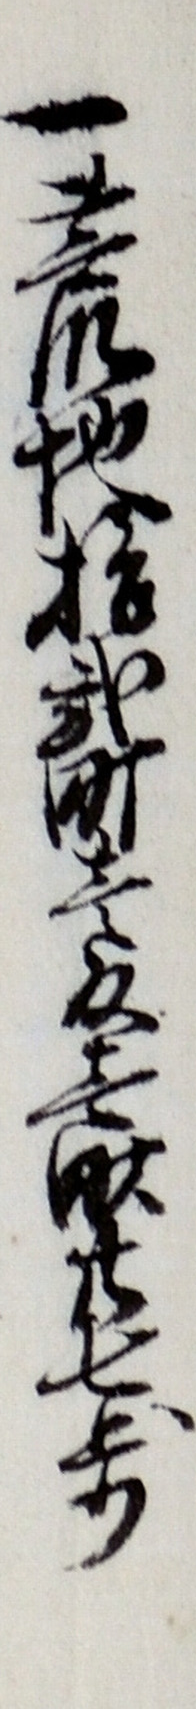一荒地拾弐町壱反壱畝廿七歩村中
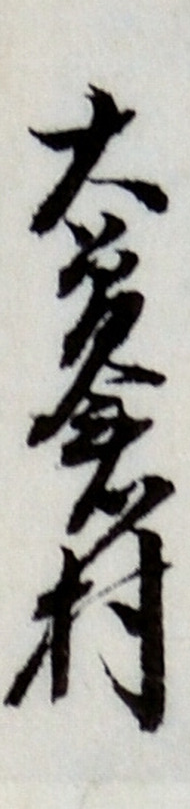大曾倉村
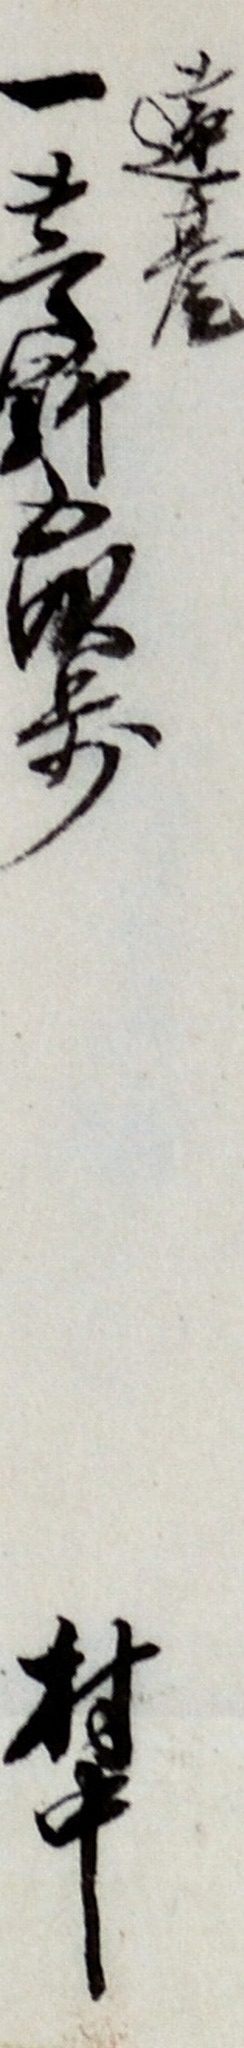一芝野五畝歩村中
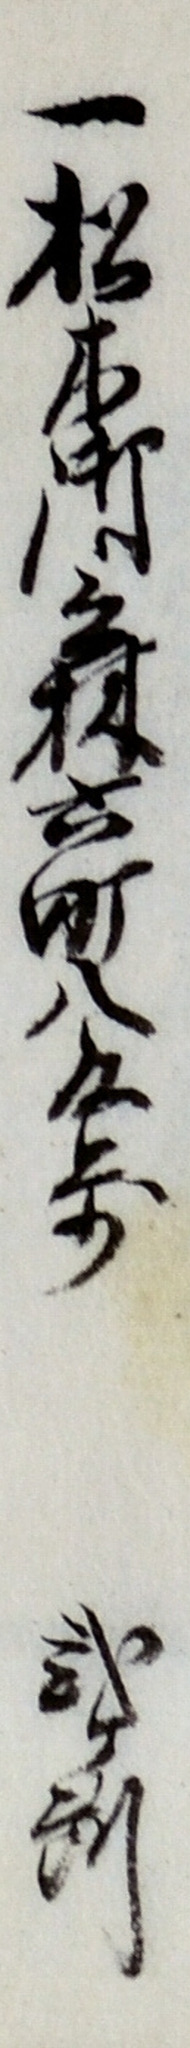一松木御立林六町八反歩弐ヶ所
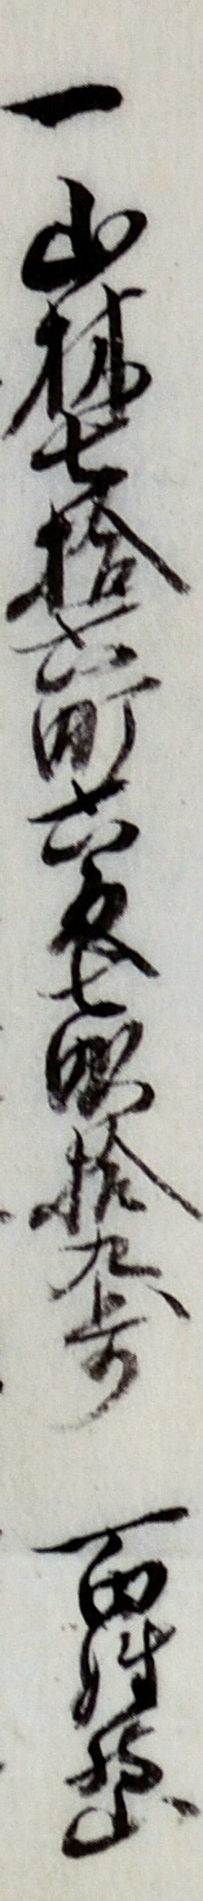一山林七拾六町六反七畝拾九歩百姓持山
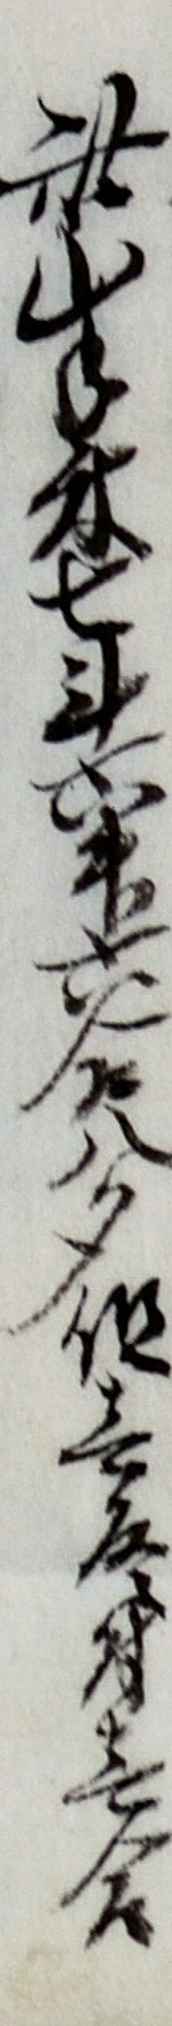此山手米七斗六升六合八勺但壱反ニ付壱合

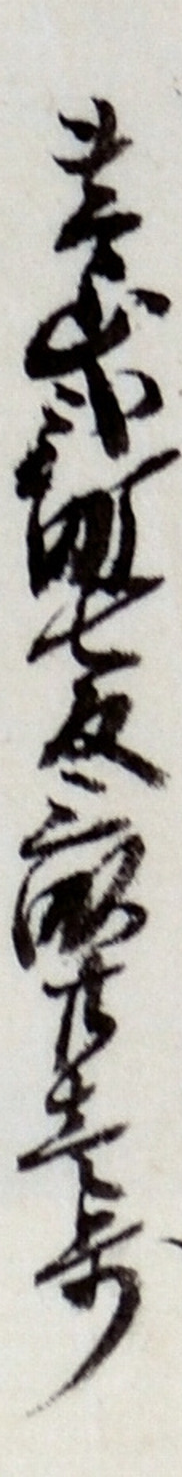芝山弐町七反三畝廿壱歩
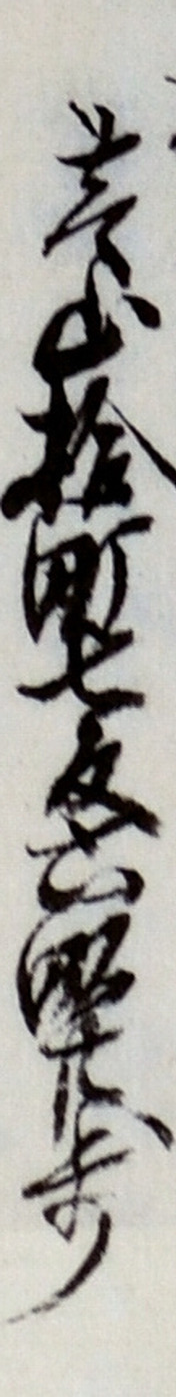芝山弐町七反三畝廿壱歩

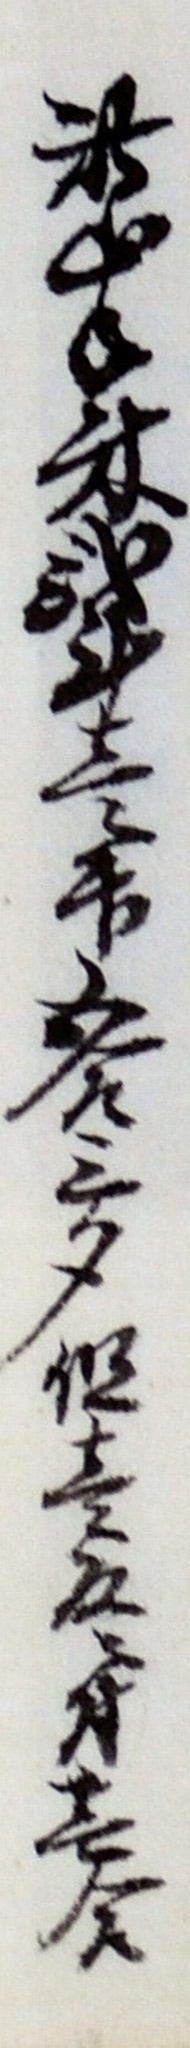此山手米弐斗壱升五合三勺但壱反ニ付壱合
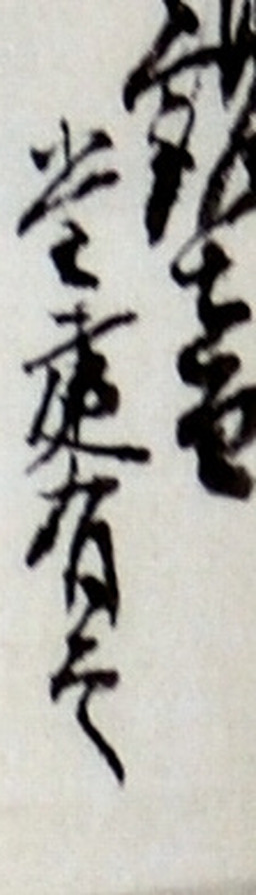堂建有之
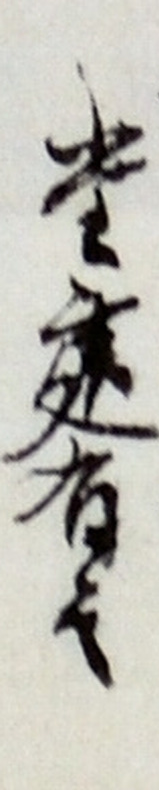堂建有之
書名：御領分中山林社地手控
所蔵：伊那市立高遠町図書館・合同会社AMANE
